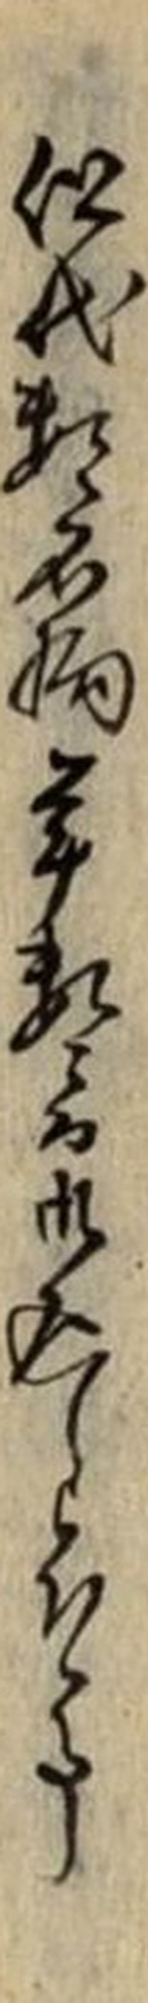但代数に不拘年数に而御返し被下候事
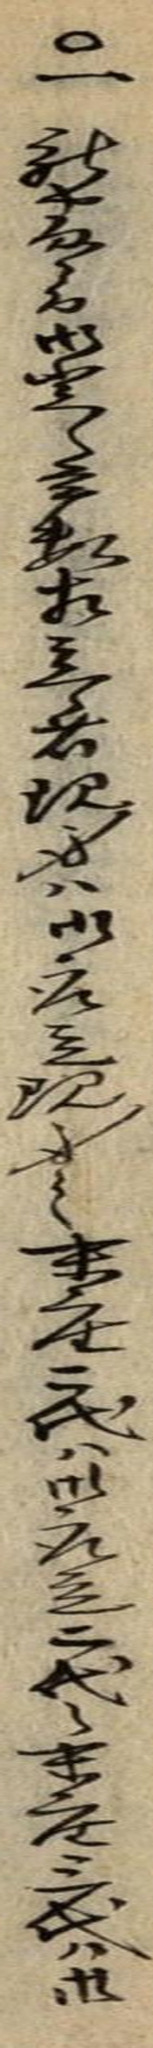○一新番に而御定之年数相立候者現身は御取立現身之末座二代は御取立二代之末座三代は御
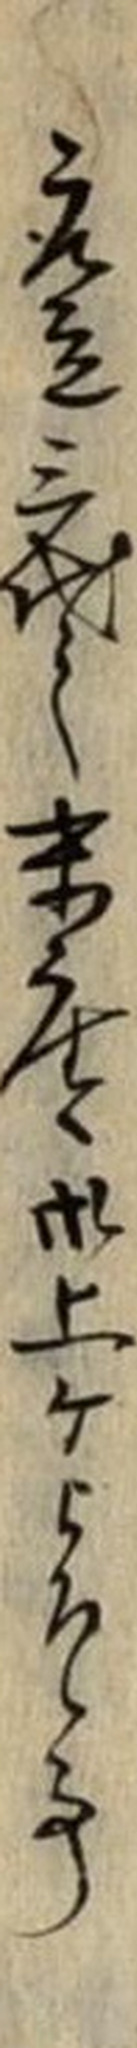御取立三代之末座へへ御上ケ被下候事
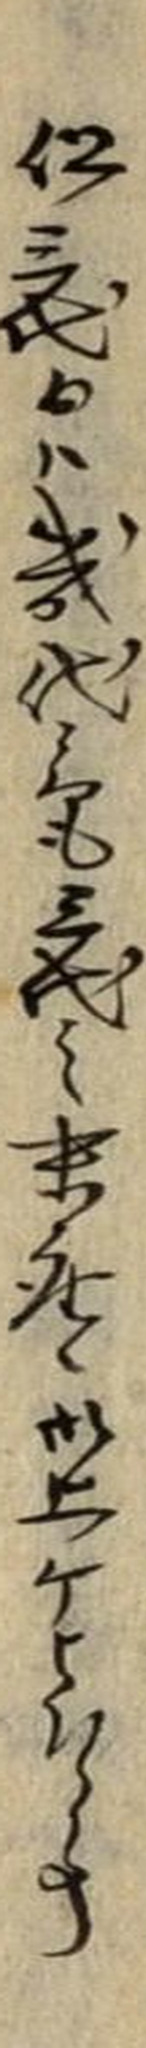但三代ゟは幾代に而も三代之末座へ御上ケ被下候事
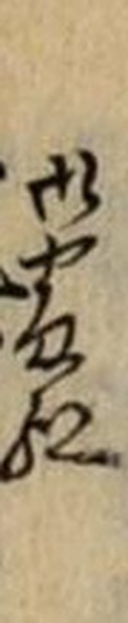御番組
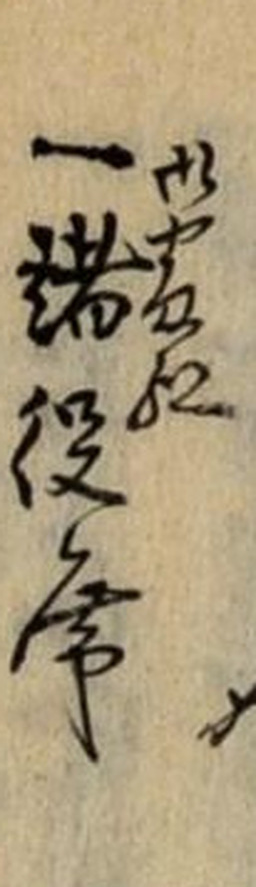一諸役席
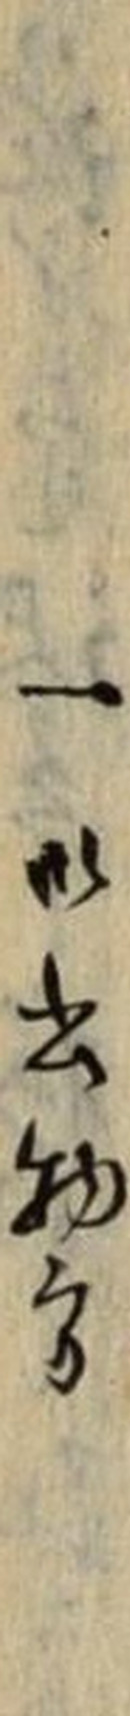一御書物方
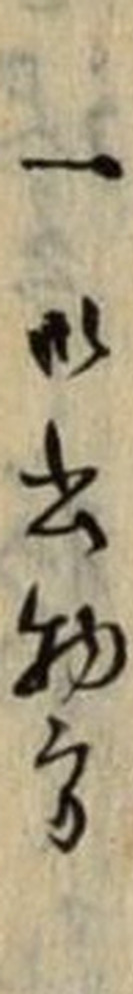一御書物方
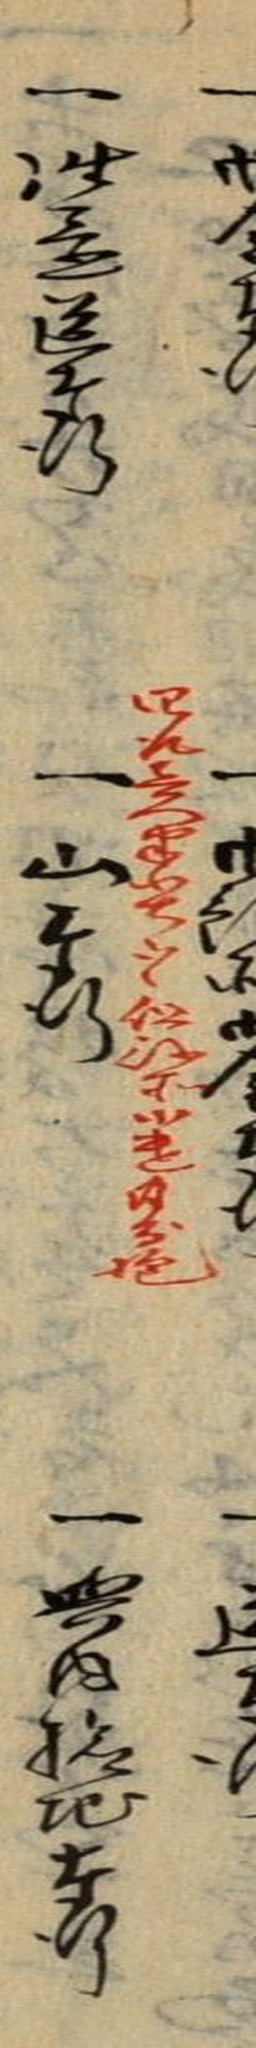一往還道奉行一山奉行一与内検地奉行
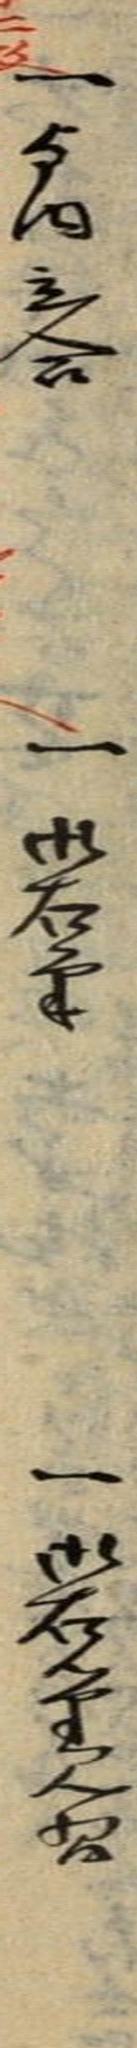一与内立合一御右筆一御右筆見習
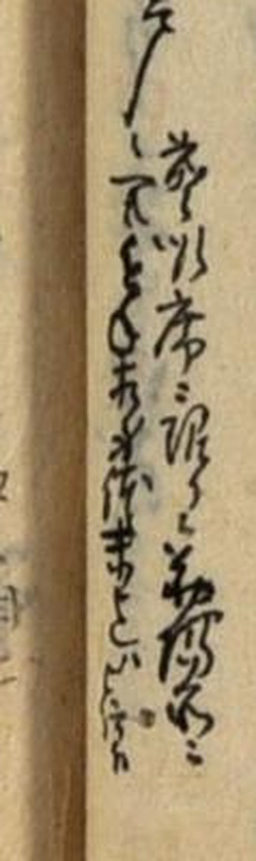候へ共近年相身体末迄は被仰付
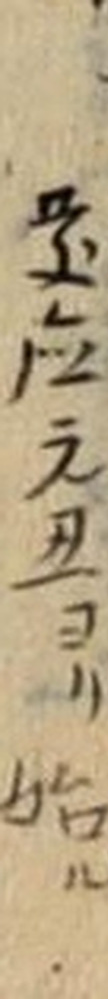慶応元丑ヨリ始ル
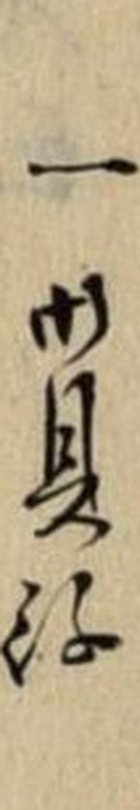一御裏役
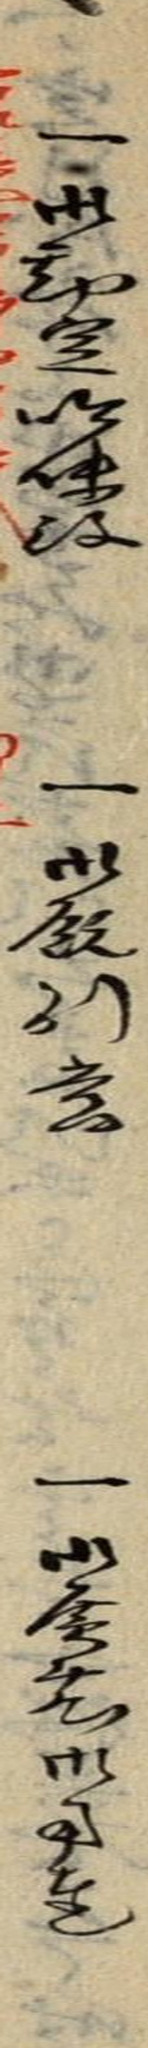一御勘定吟味役一御厩別当一御広敷御用達
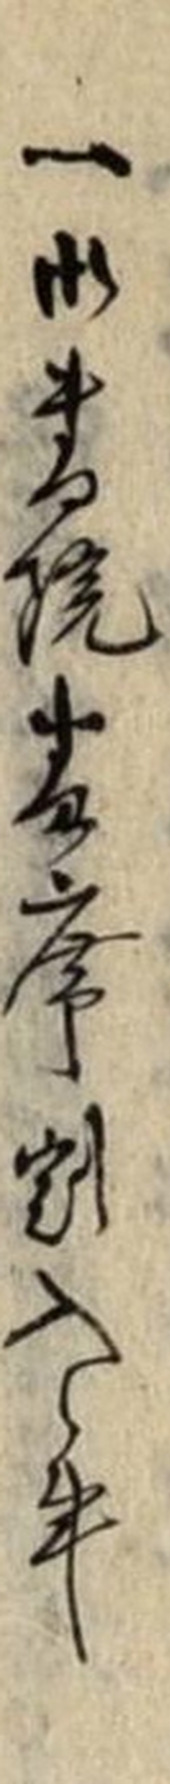一御書院番席割入候事
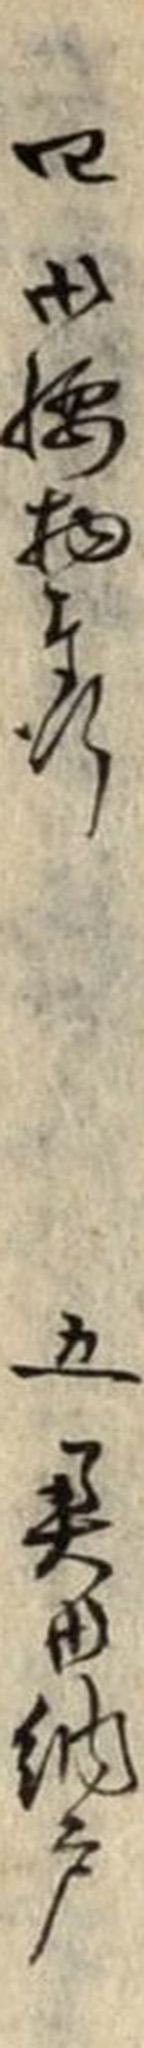四御腰物奉行五奥御納戸
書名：御用并被仰出之部
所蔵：福井県文書館 Fukui Prefectural Archives
